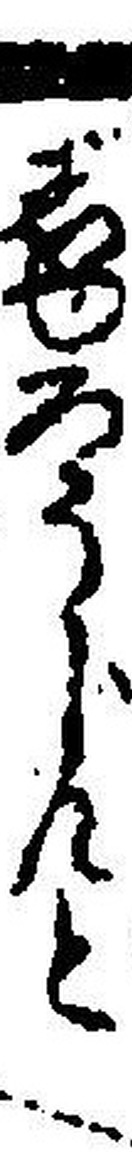じゆろうじんと
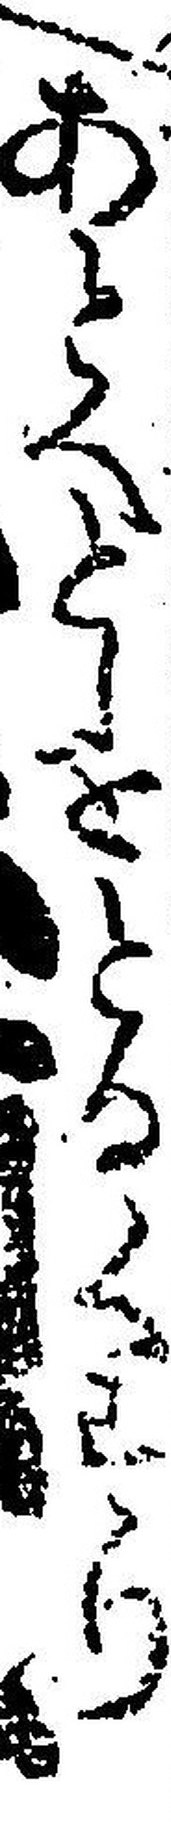あとへとしをとるくすり
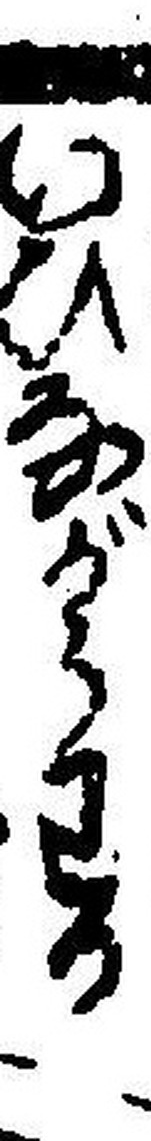いひながらわか
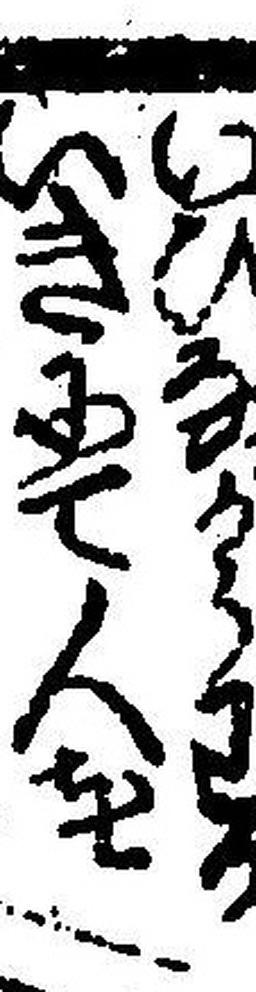いきにて人を
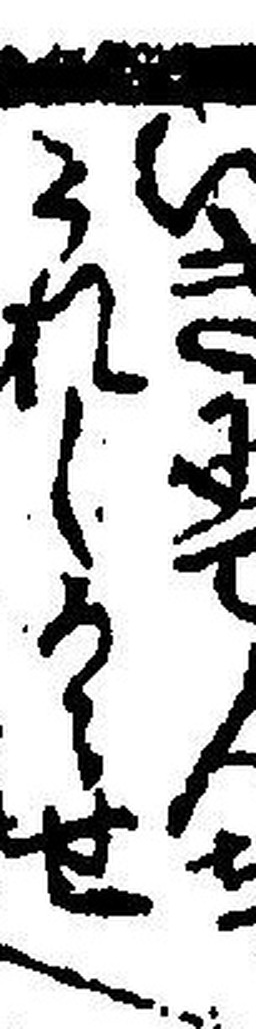うれしからせ
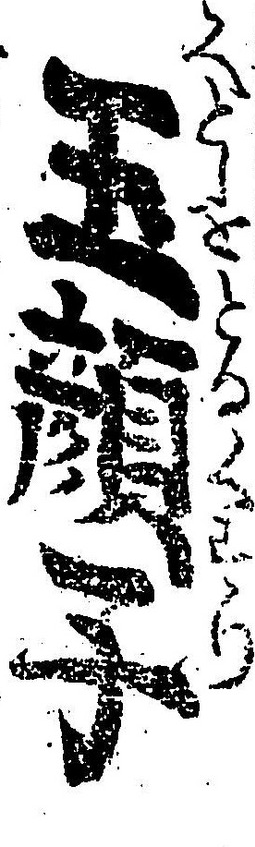玉顔子
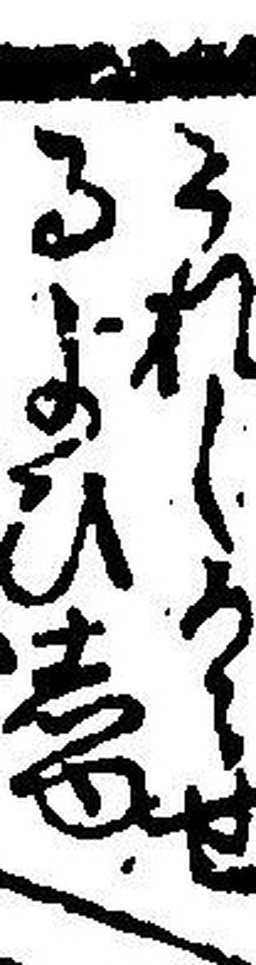るよひしゆ
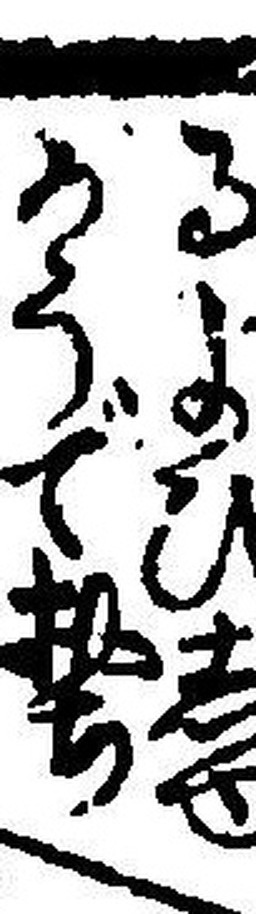かうでおち
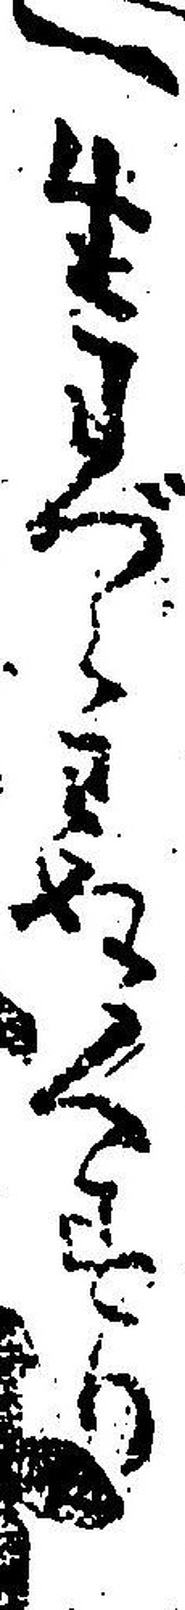一生わづらわぬくすり
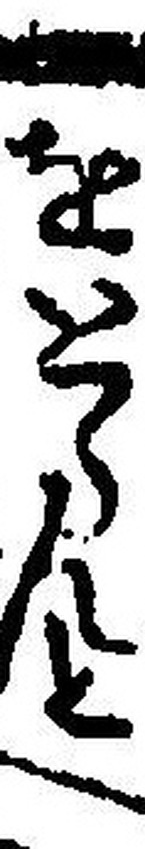をとらんと
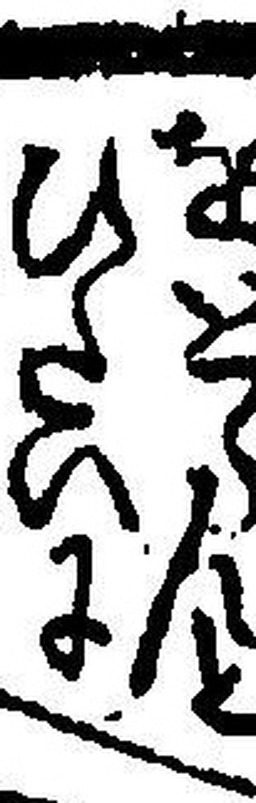ひたいに
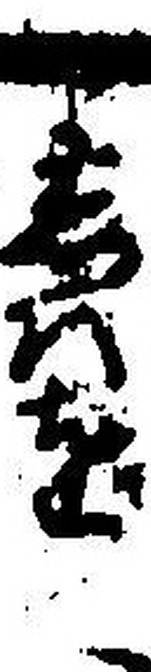しはを
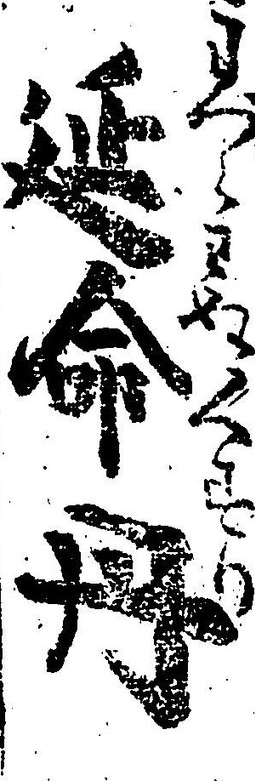延命丹
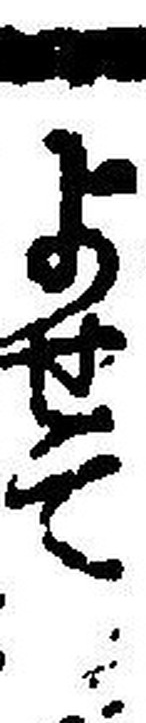よせて
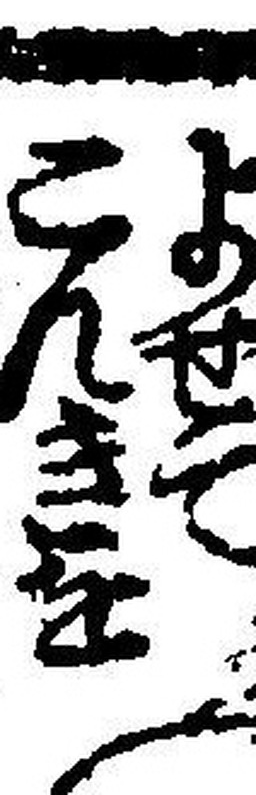こんきを
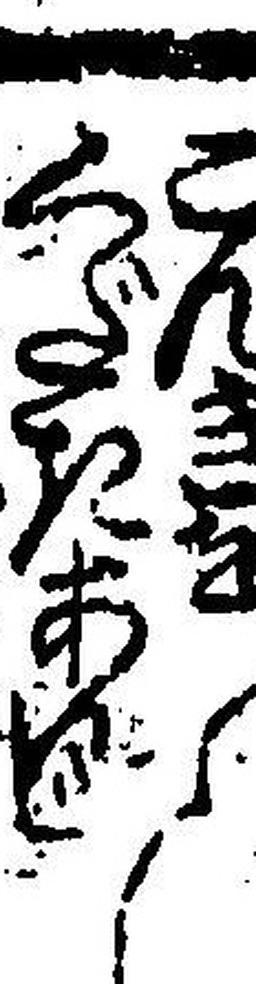くだきあんじ
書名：徳若水縁起金性 / 樹下石上作
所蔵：東京大学総合図書館 General Library in the University of Tokyo, JAPAN
